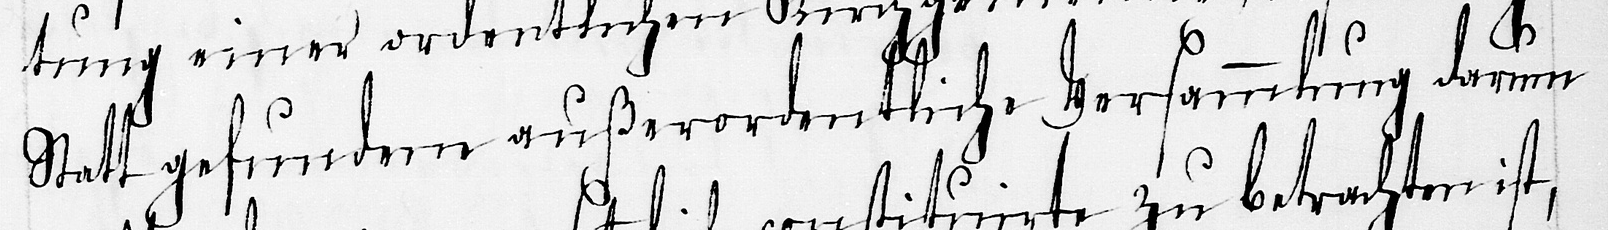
Statt gefundene außerordentliche Versammlung darum
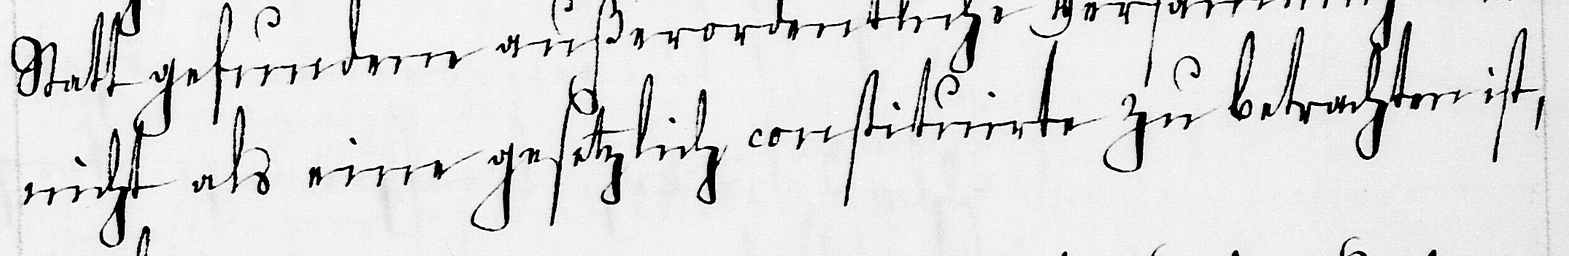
nicht als eine gesetzlich constituirte zu betrachten ist,
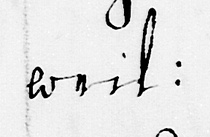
weil:
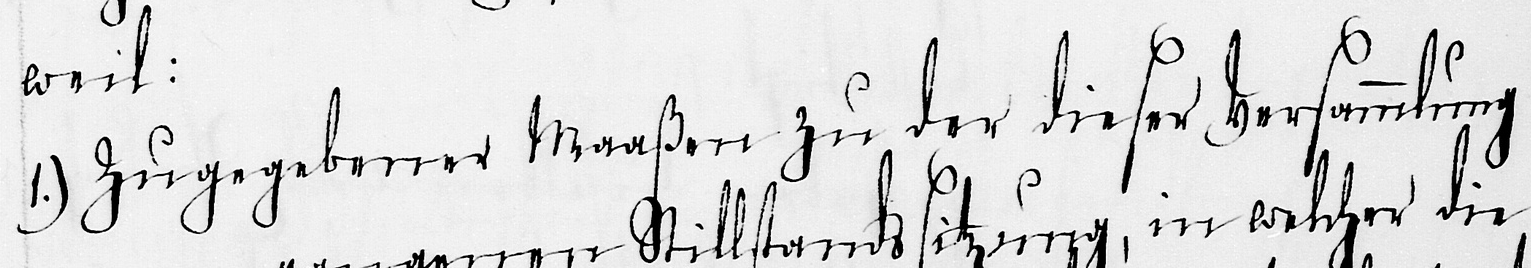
1.) Zugegebener Maaßen zu der dieser Versammlung
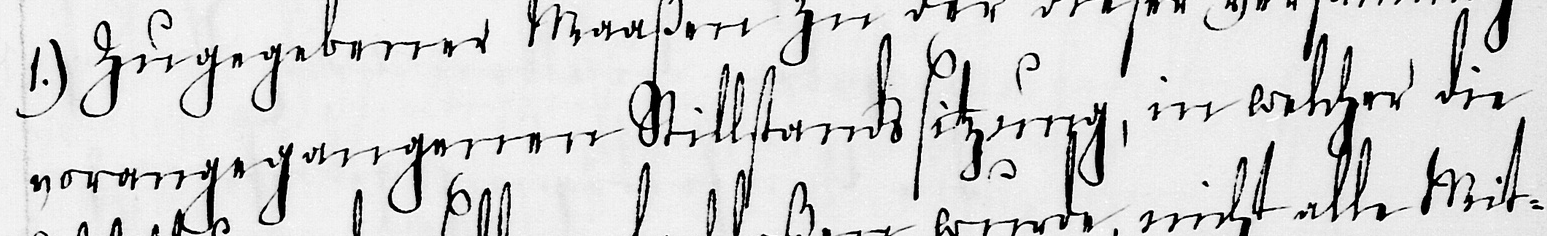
vorangegangenen Stillstandssitzung, in welcher die
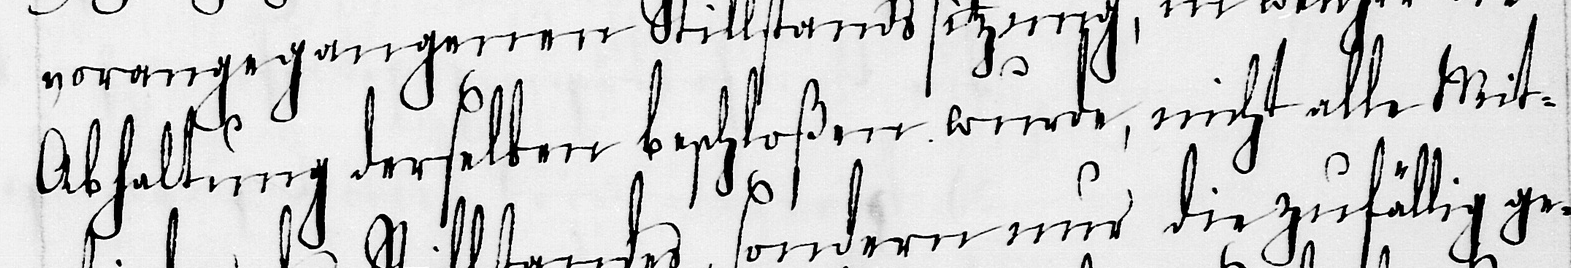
Abhaltung derselben beschloßen wurde, nicht alle Mit¬
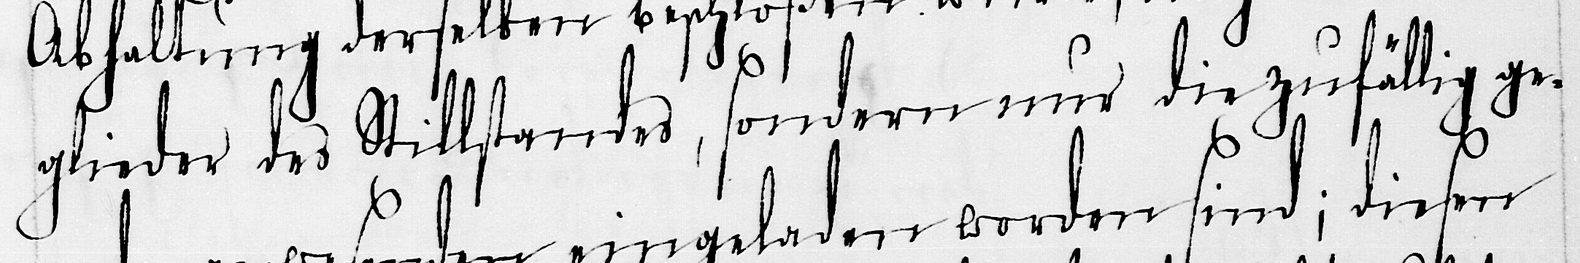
glieder des Stillstandes, sondern nur die zufällig ge¬
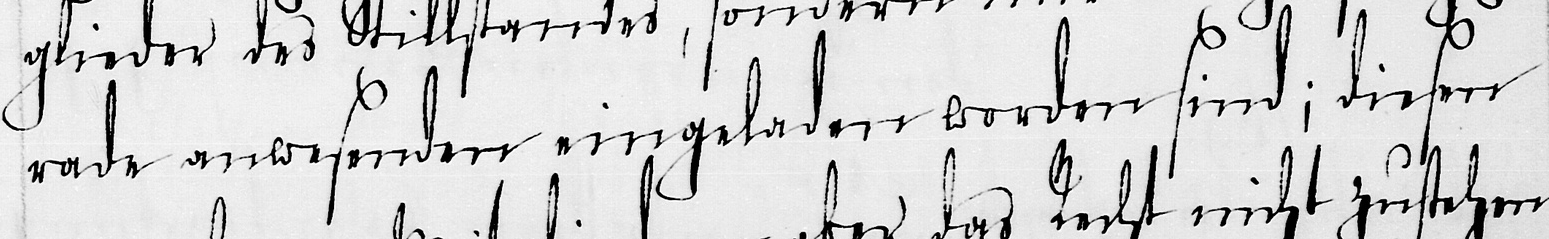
rade anwesenden eingeladen worden sind; diesen
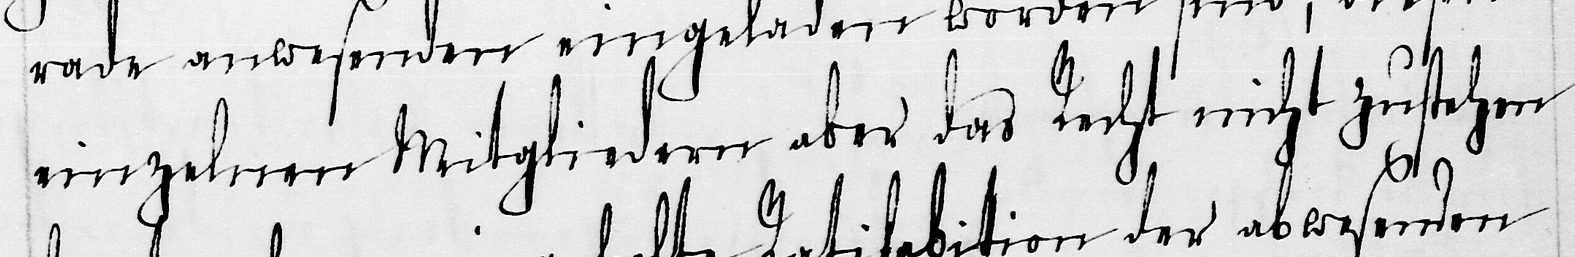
einzelnen Mitgliedern aber das Recht nicht zustehen
